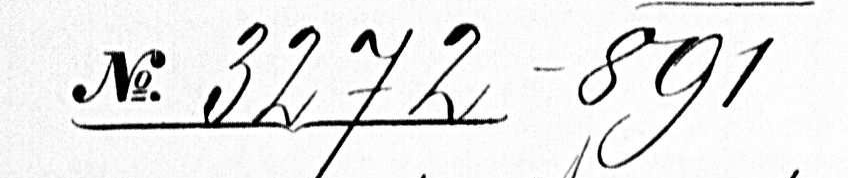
No. 3272 - 1891
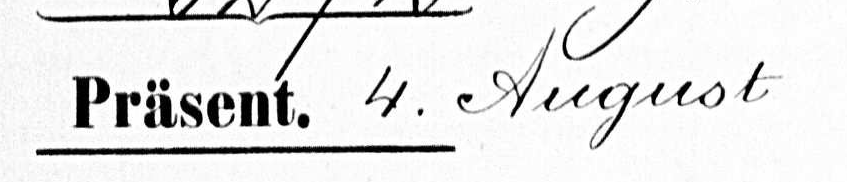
Präsent. 4. August
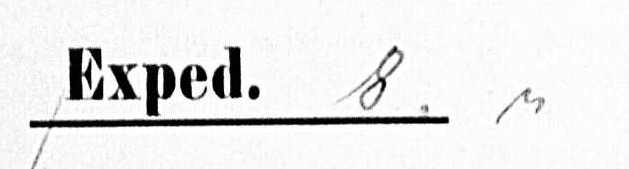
Exped. 8. „
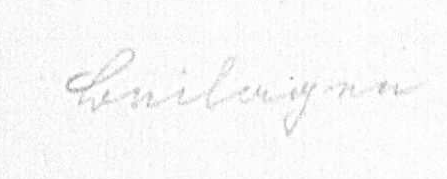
Beilagen
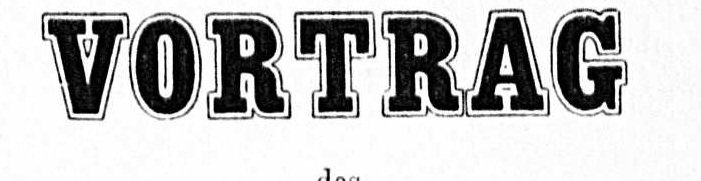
Vortrag
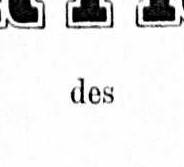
des
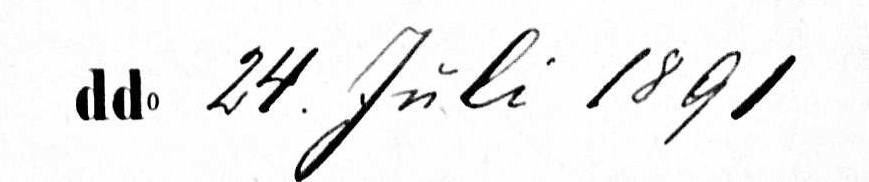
ddo 24. Juli 1891
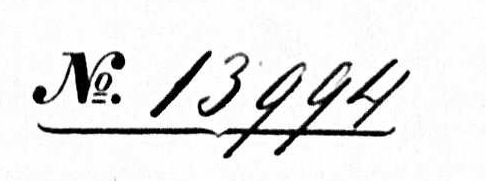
No. 13994
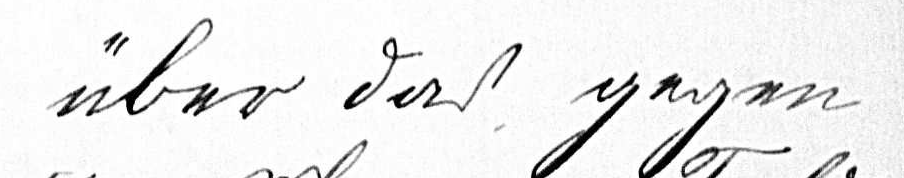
Über das gegen
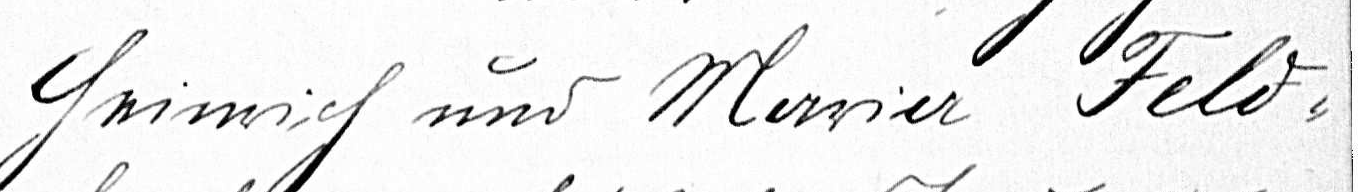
Heinrich und Maria Feld¬
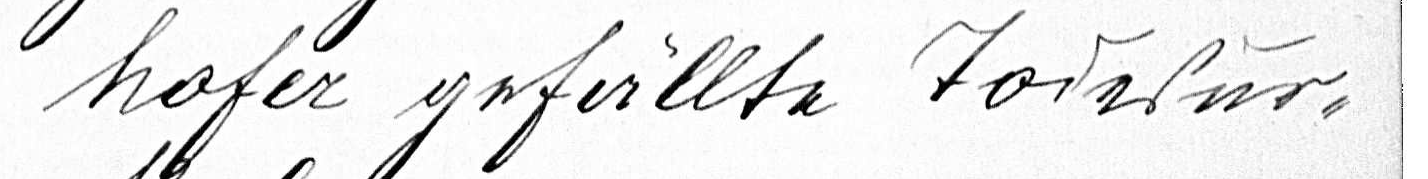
hofer gefällte Todesur¬
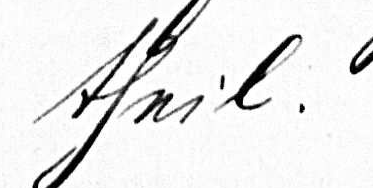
theil.
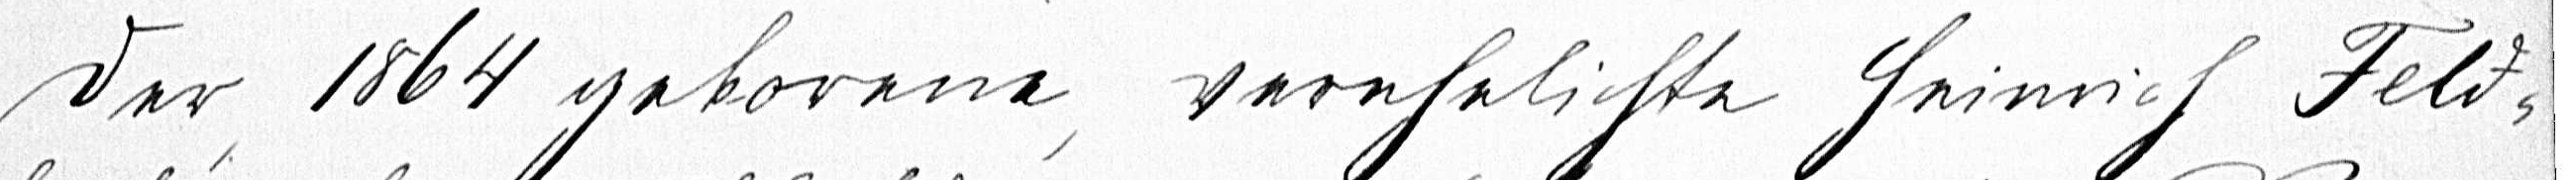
Der 1864 geborene, verehelichte Heinrich Feld¬
